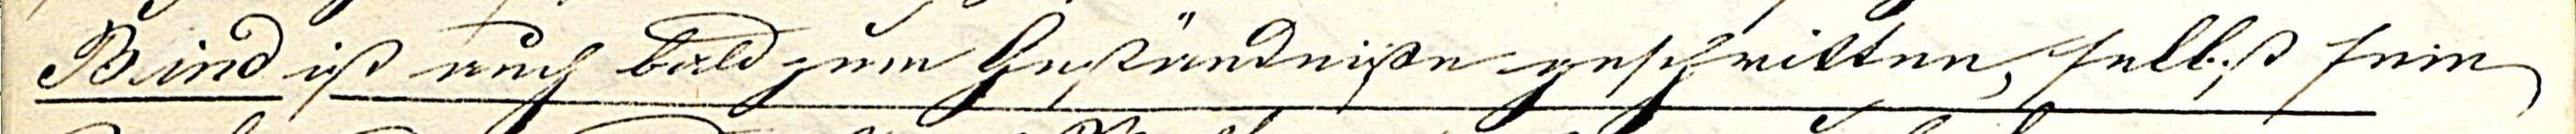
Bind ist auch bald zum Geständniße geschritten, selbst sein
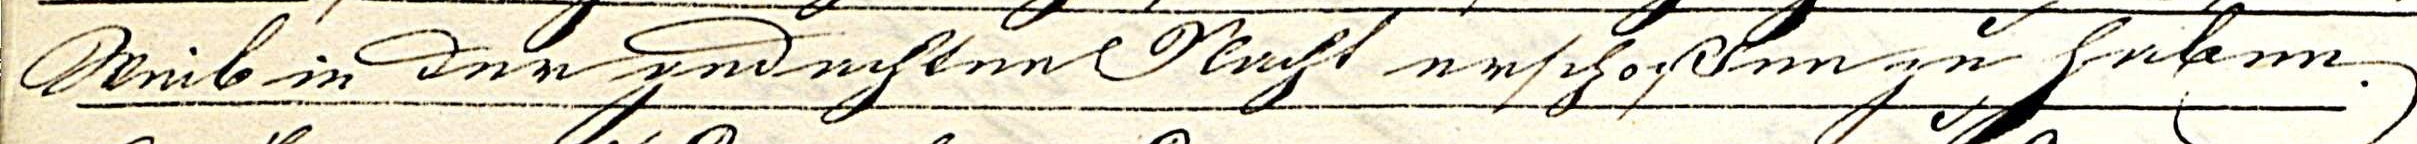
Weib in der gedachte Nacht erschossen zu haben.
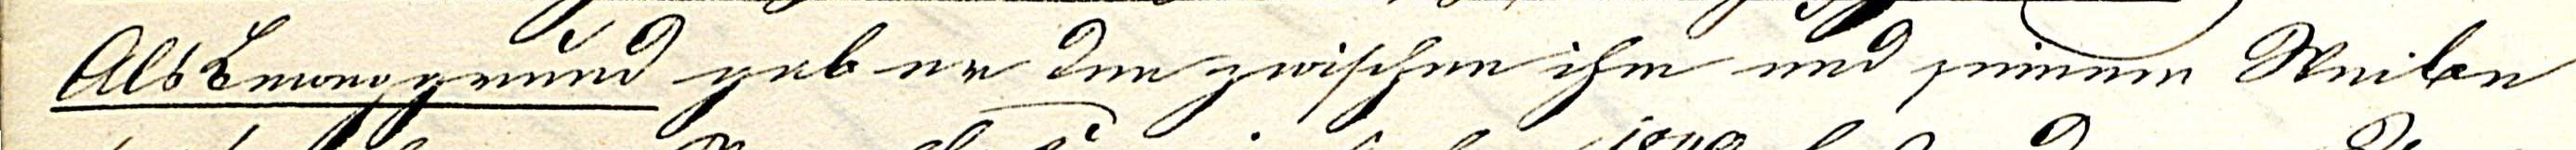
Als Beweggrund gab er den zwischen ihm und seinem Weibe
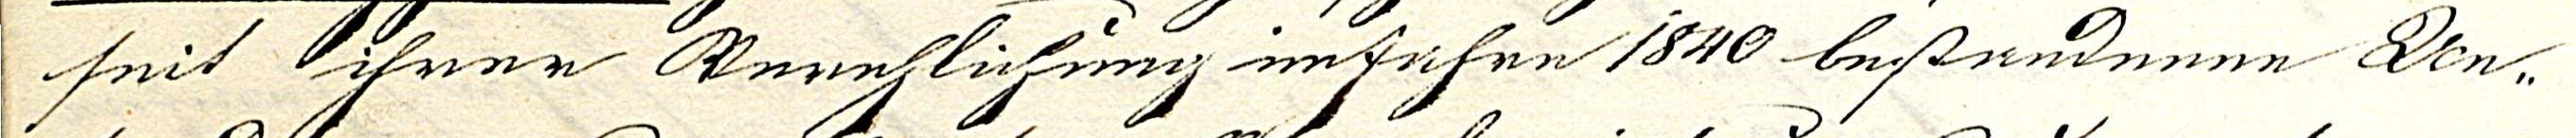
seit ihrer Verehelichung im Jahre 1840 bestandenen Un¬
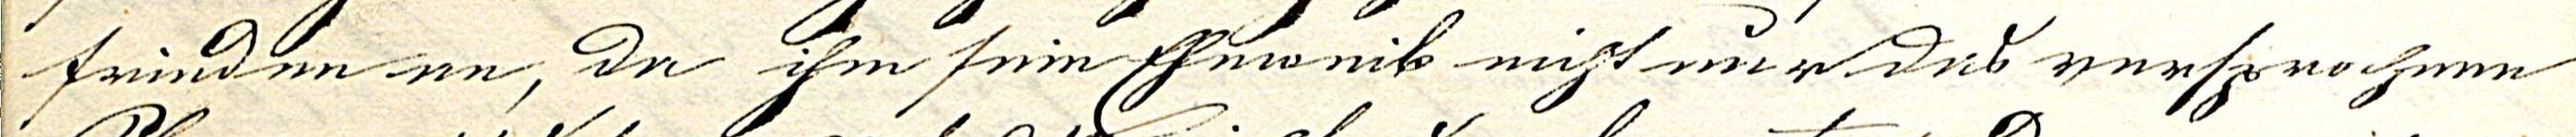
frieden an, da ihm sein Eheweib nicht nur das versprochene
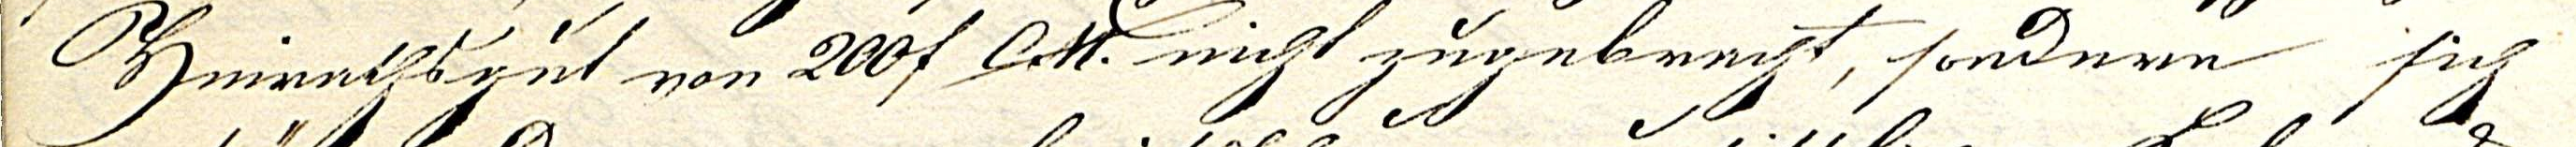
Heirathsgut von 200f xx nicht zugebracht, sondere sich
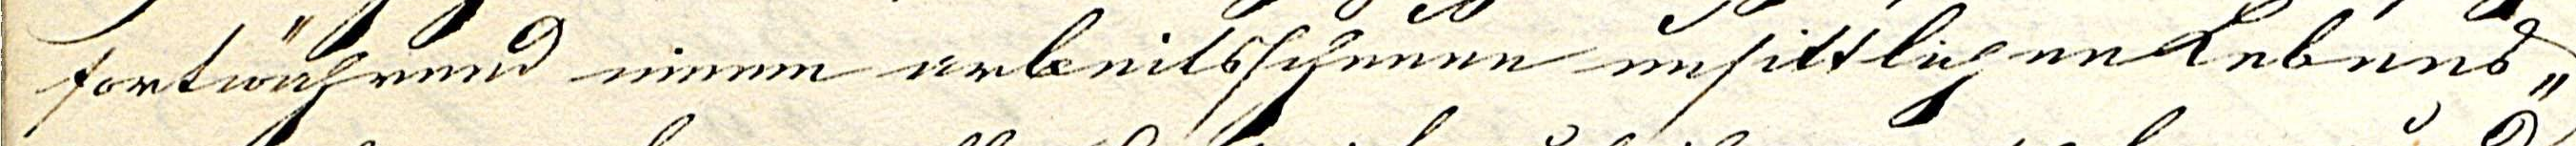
fortwährend einem arbeitsscheuen unsittlich an Lebens¬
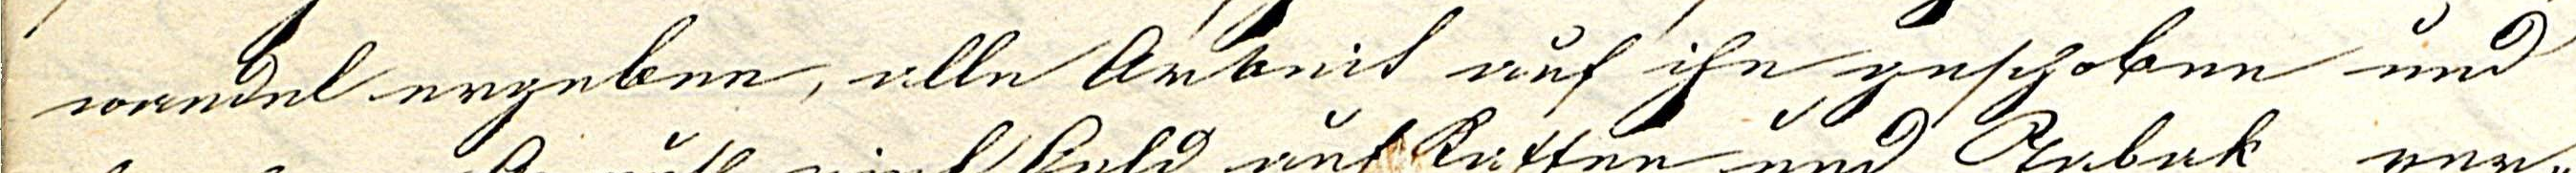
wandel ergeben, alle Arbeit auf ihn geschoben und
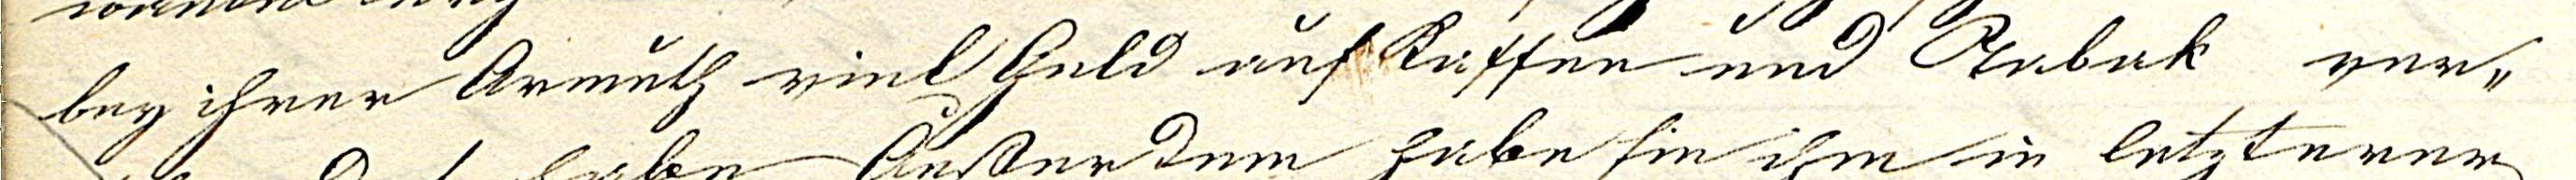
bey ihrer Armuth viel Geld auf Kaffen und Tabak ver¬
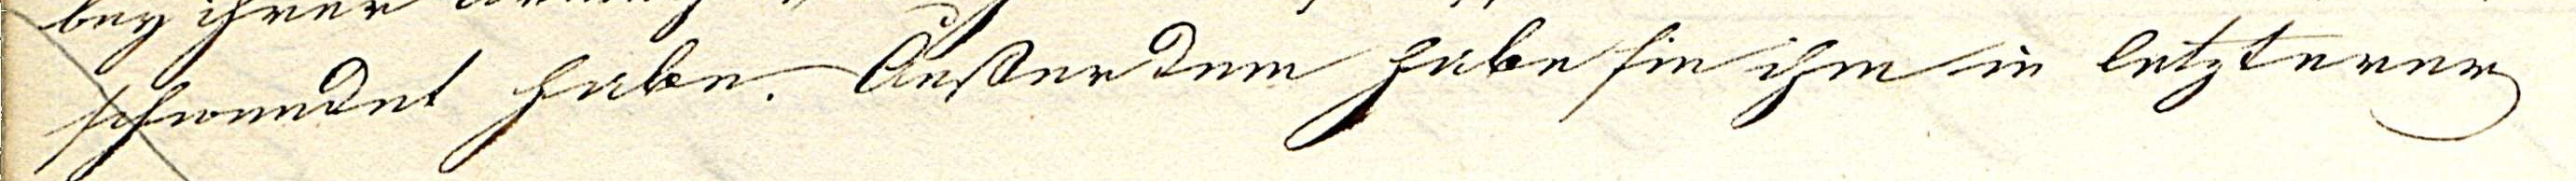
schwendet habe. Außerdem habe sie ihm in letzterer
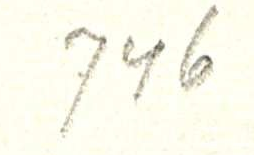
746
